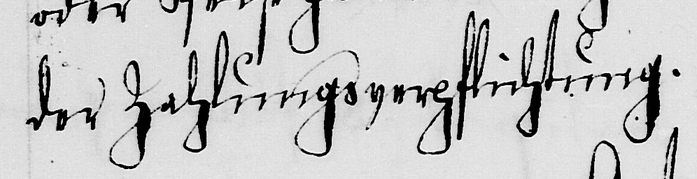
der Zahlungsverpflichtung.
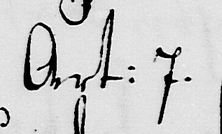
Art: 7.
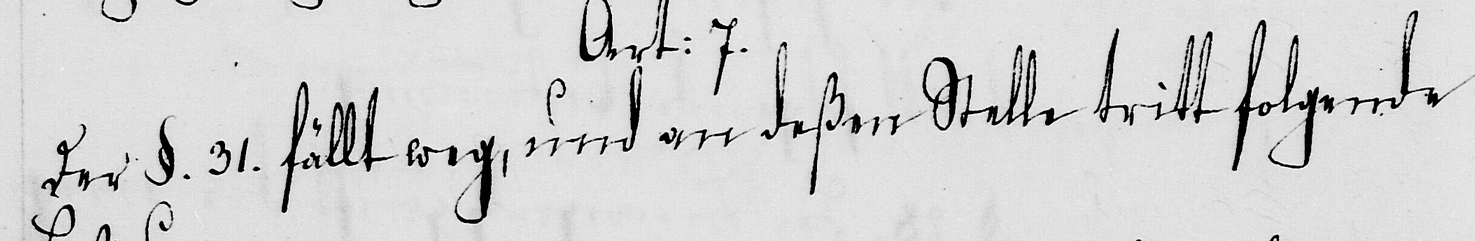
Der §. 31. fällt weg, und an deßen Stelle tritt folgende
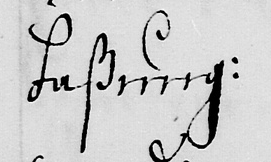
Faßung:
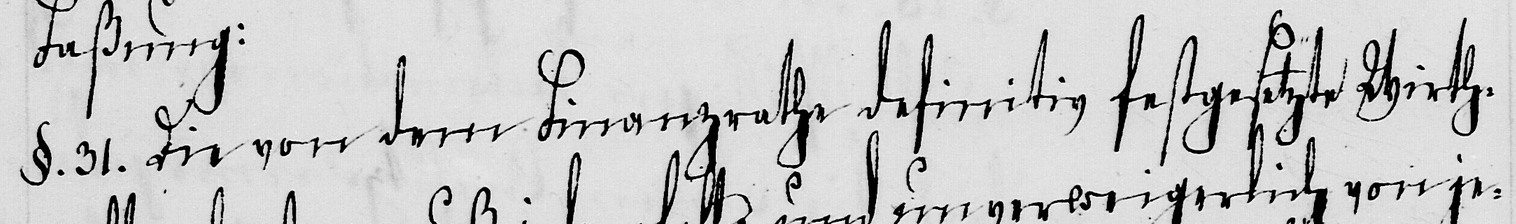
§. 31. Die von dem Finanzrathe definitiv festgesetzte Wirth¬
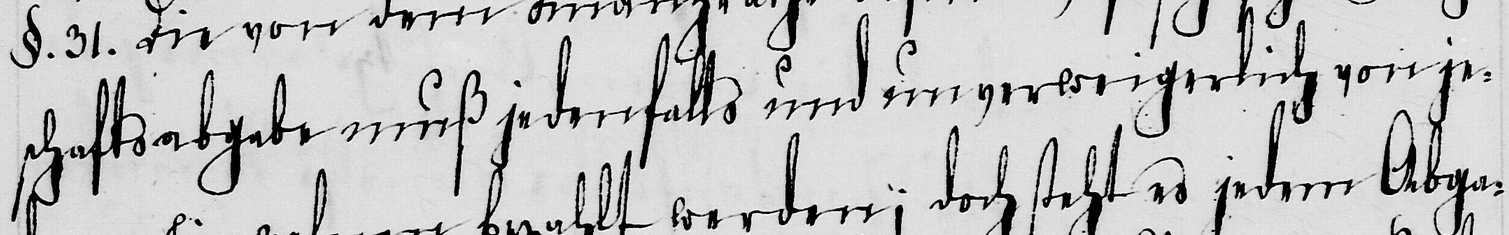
schaftsabgabe muß jedenfalls und unverweigerlich von je¬
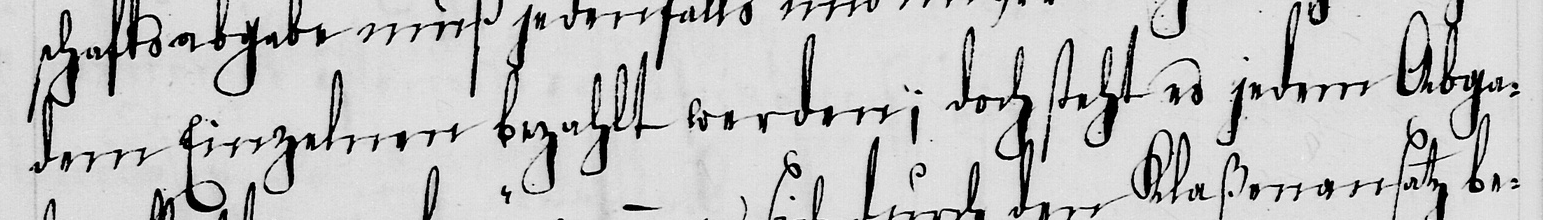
dem Einzelnen bezahlt werden; doch steht es jedem Abga¬
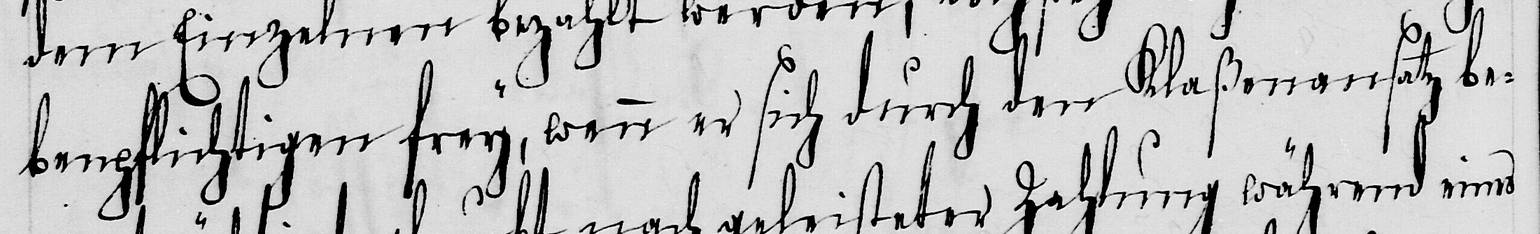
benpflichtigen frey, wenn er sich durch den Klaßensatz be¬
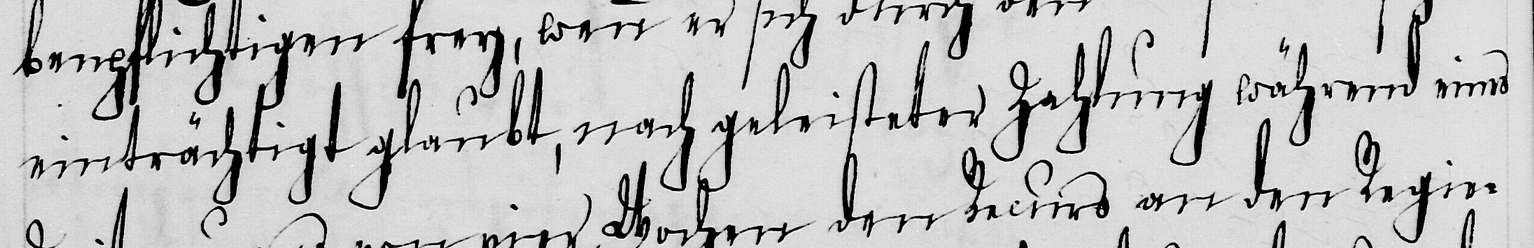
einträchtigt glaubt, nach geleisteter Zahlung während eines
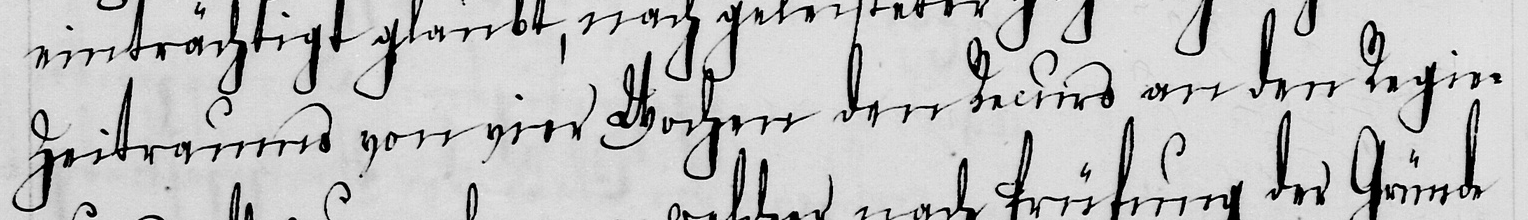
Zeitraumes von vier Wochen den Recurs an den Regie¬
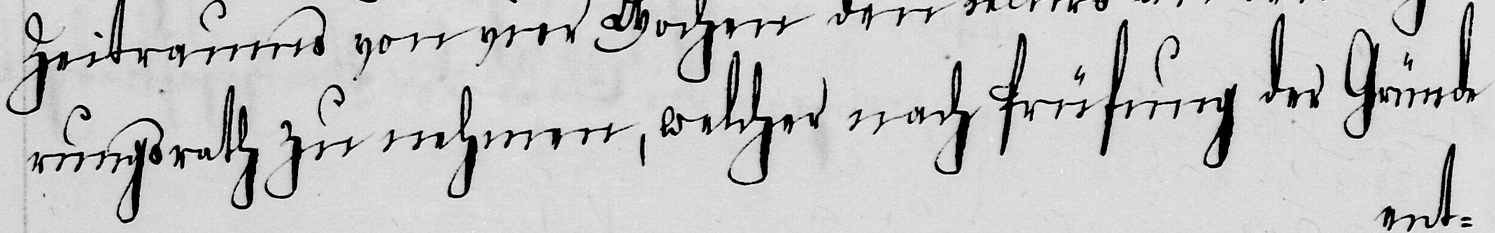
rungsrath zu nehmen, welcher nach Prüfung der Gründe
